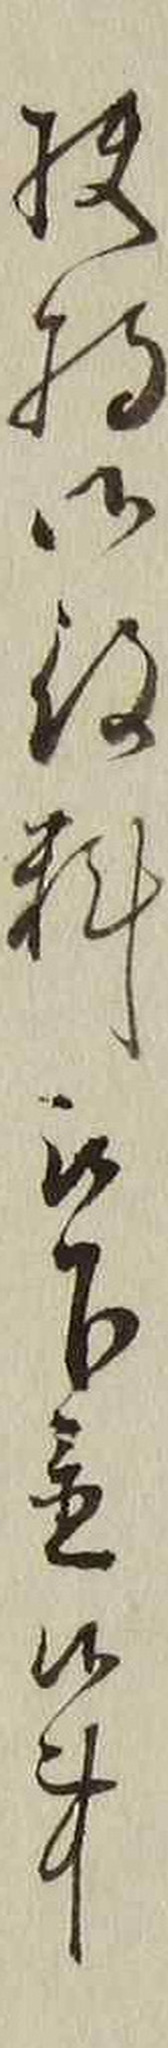扶持御役料被下置候事
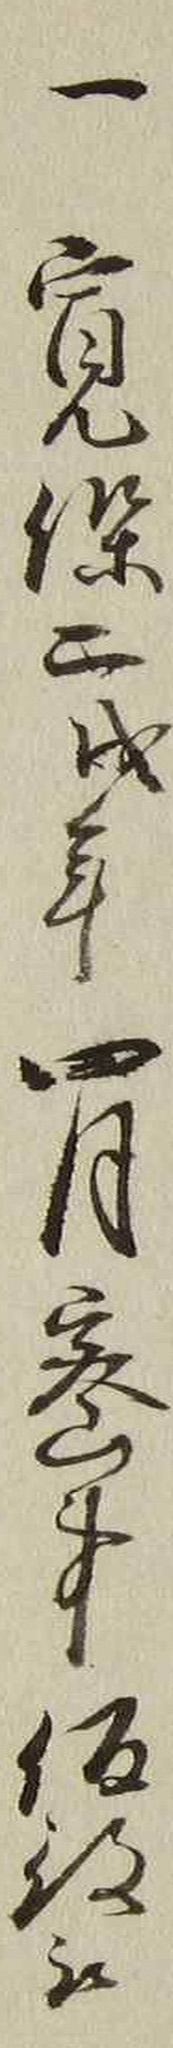一寛保二戌年四月密事仮役被
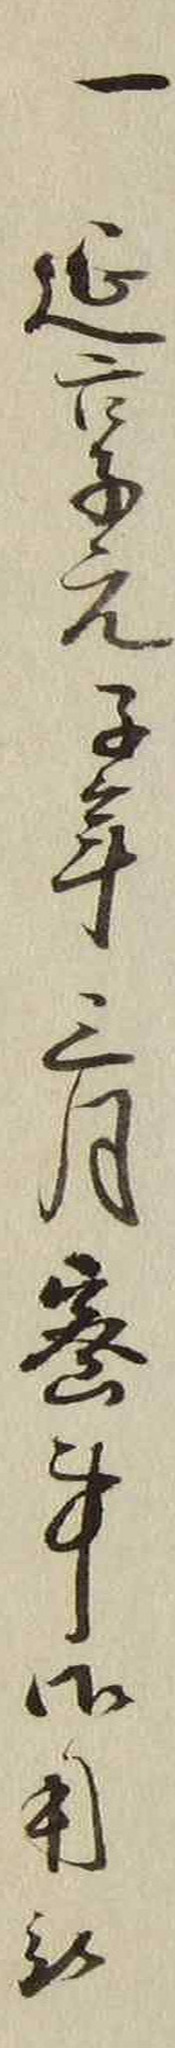一延享子年三月密事御用被
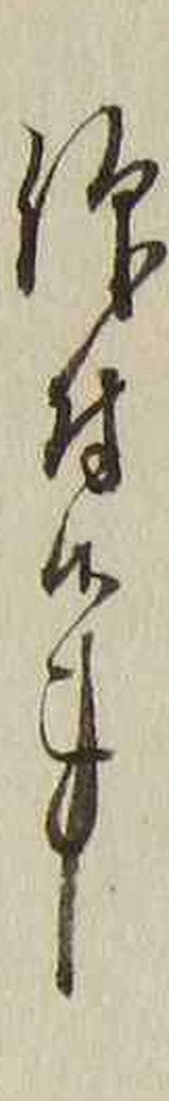仰付候事
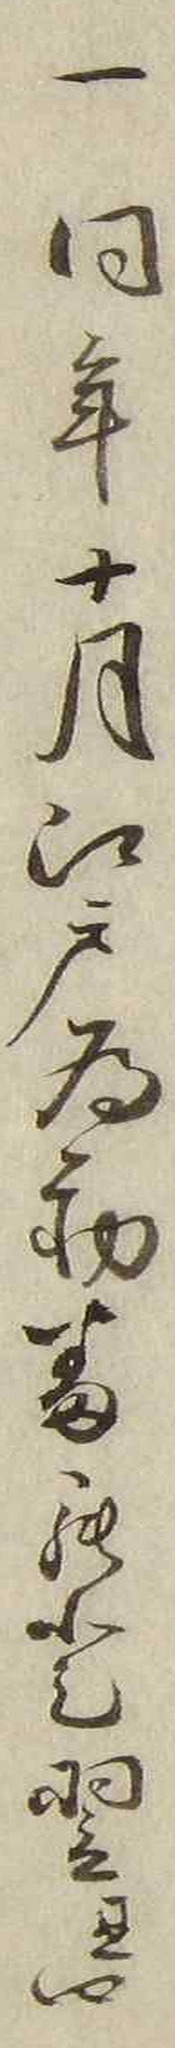一同年十月江戸為勤番罷登翌丑四

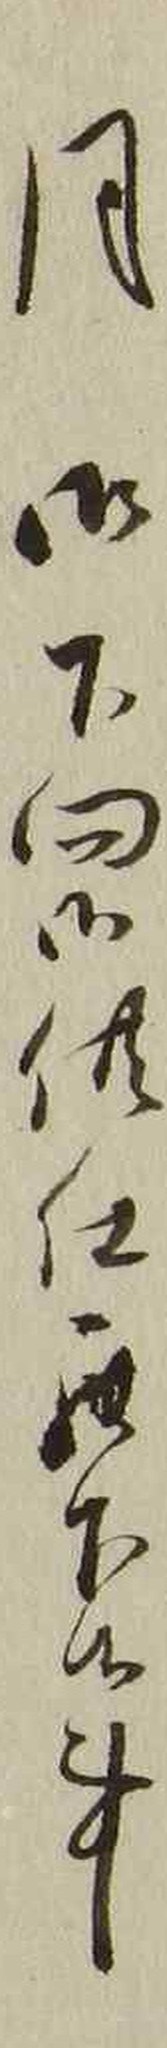月御下向御供仕罷下候事
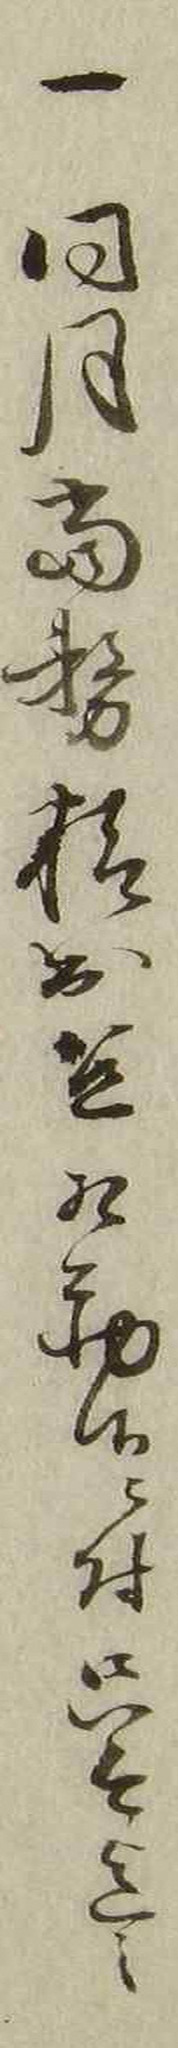一同月当務精出宜相勤候ニ付只今迄之
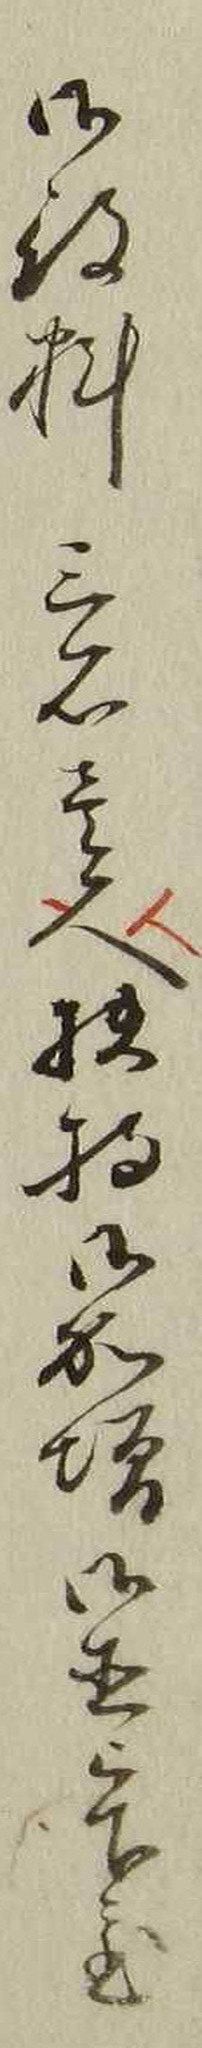御役料三石壱人扶持御加増御直被下置
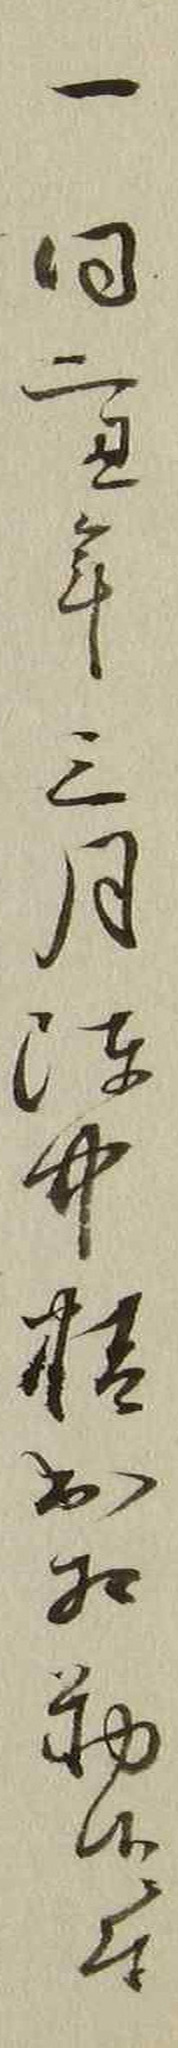一同二丑年三月陣中精出相勤候ニ付
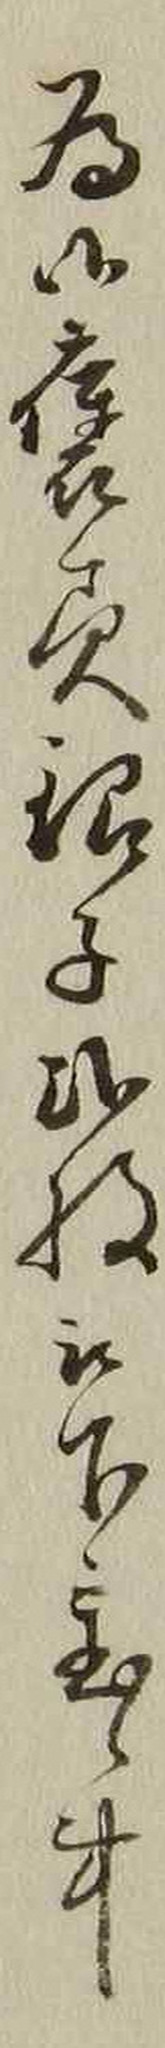為御褒美銀子弐枚被下置候事
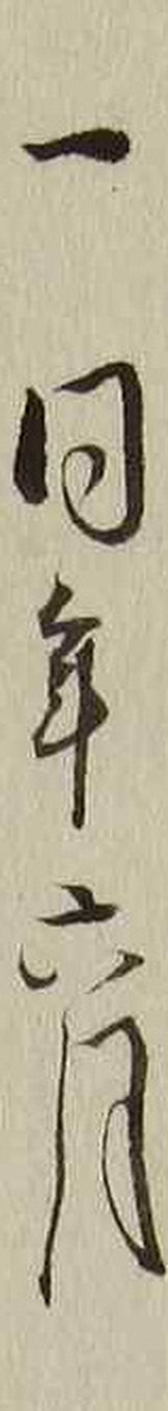一同年六月
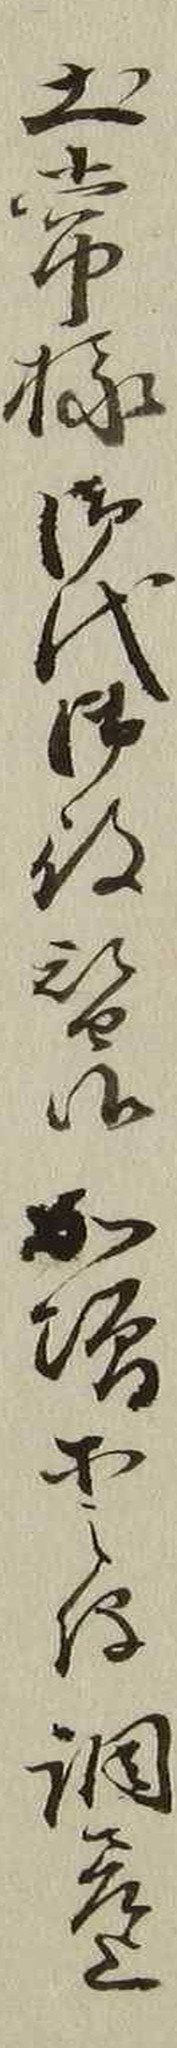土常様御代御役替御加増等之儀調差上
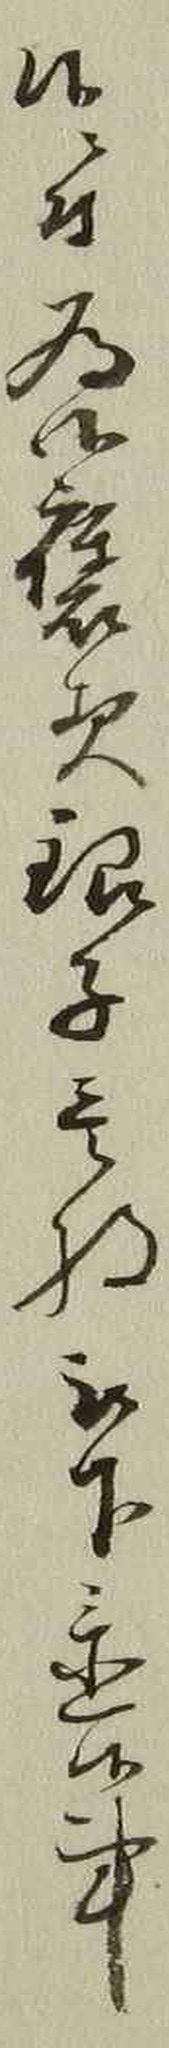候ニ付為御褒美銀子壱枚被下置候事
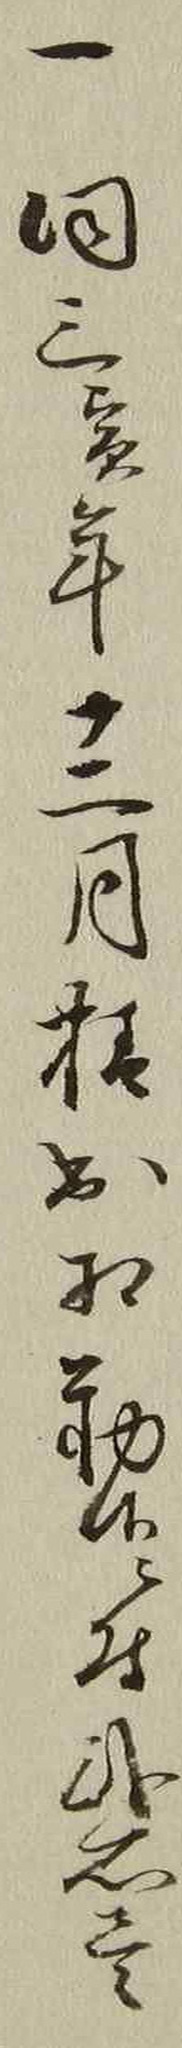一同三寅年十二月精出相勤候ニ付弐石壱
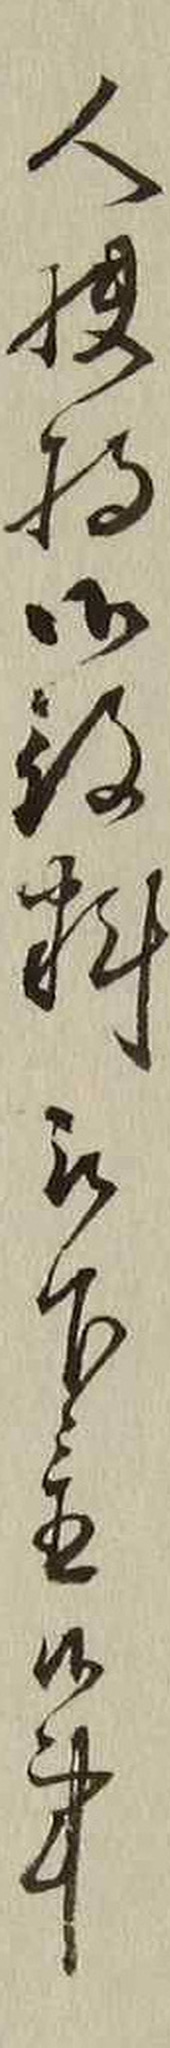人扶持御役料被下置候事
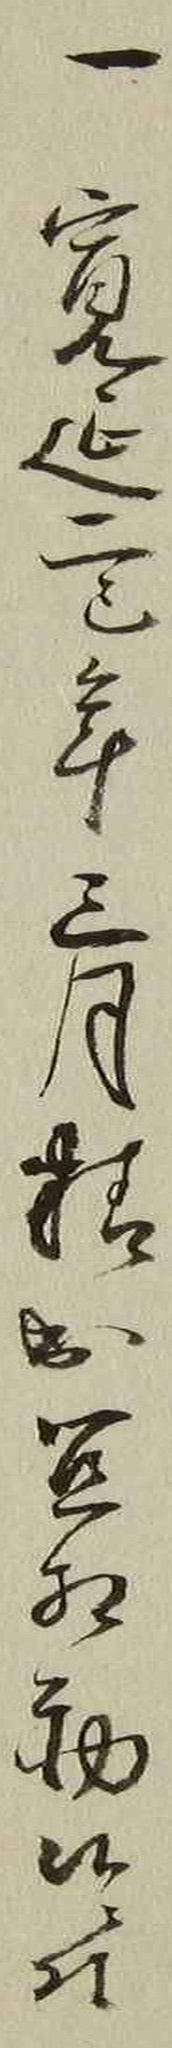一寛延二巳年三月精出宜相勤候ニ付
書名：諸士系譜　巻之129　た之部5
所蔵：会津若松市立会津図書館
